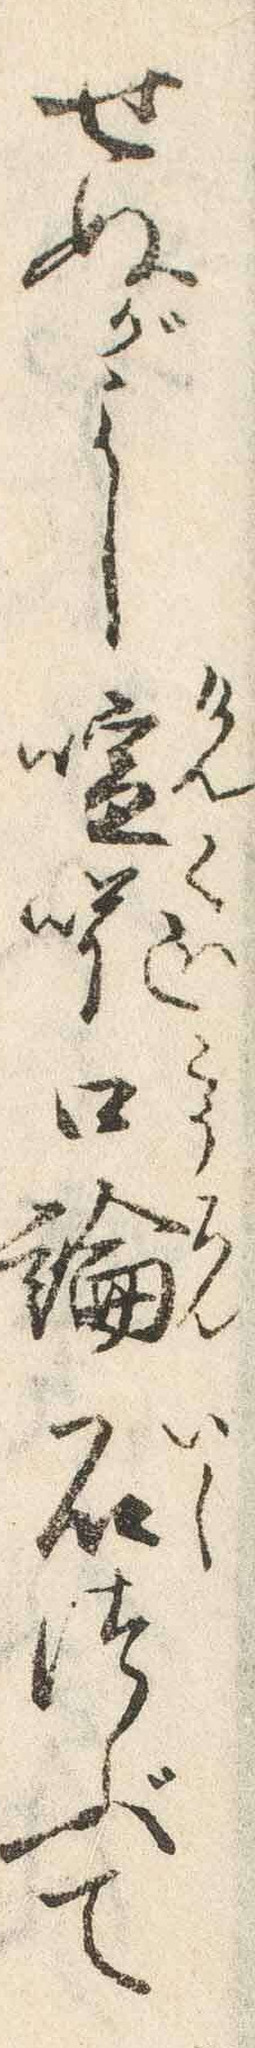せぬがよし喧𠵅口論石つぶて
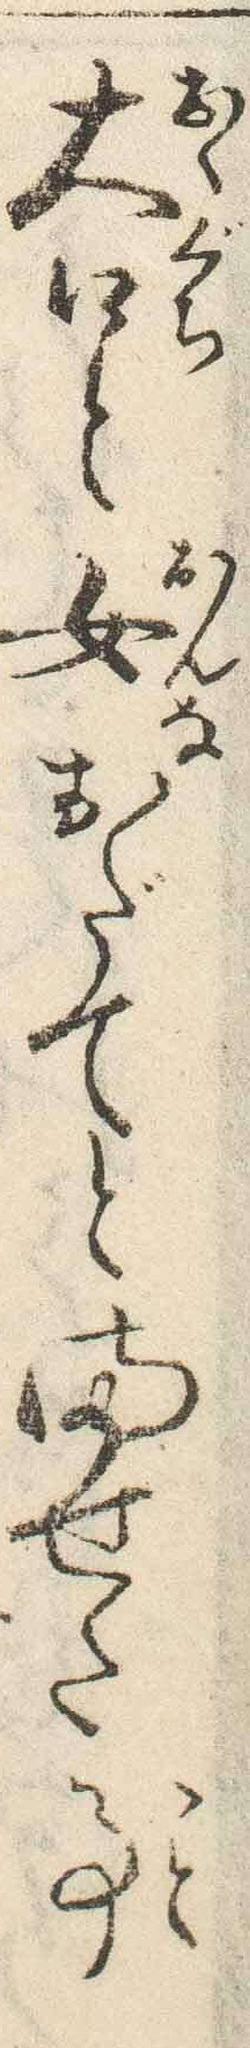大口と女おだてとませた事
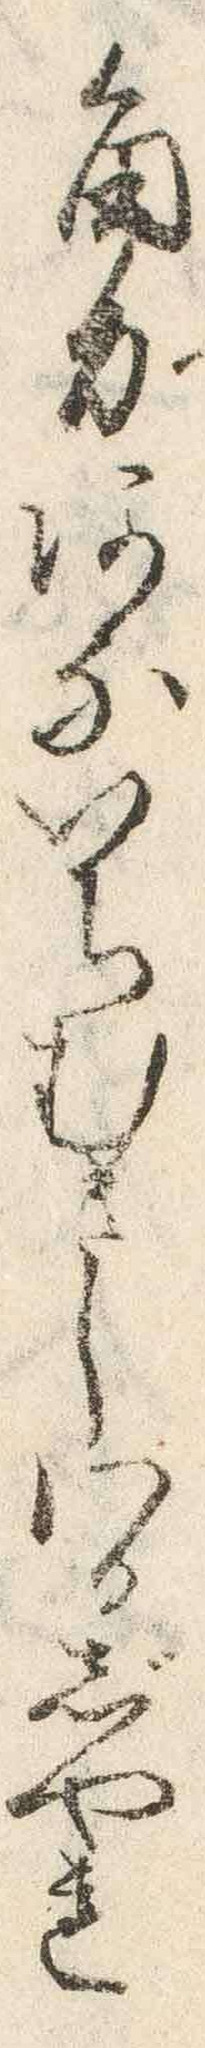角力あないちむさしわるじやれ
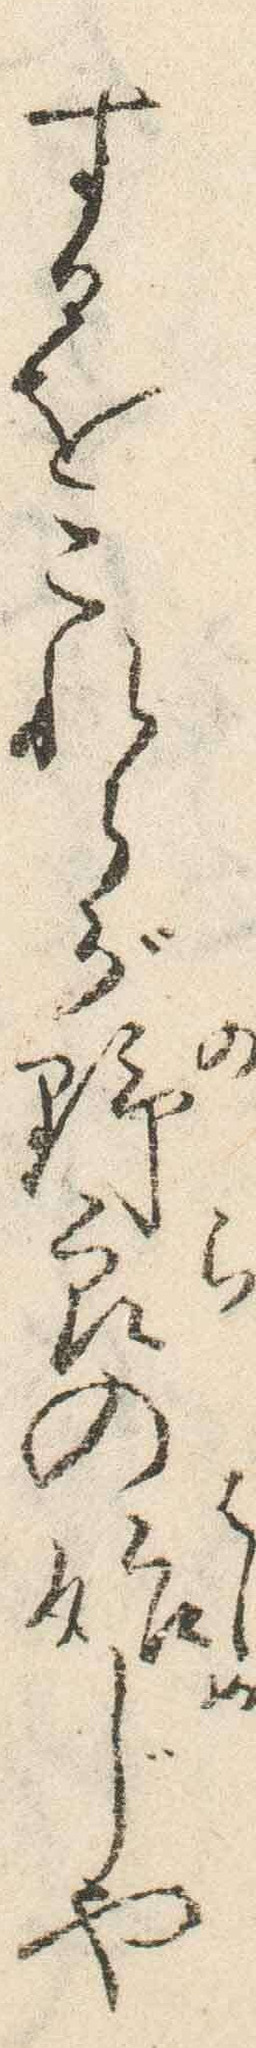するをこれらが野良の始じや
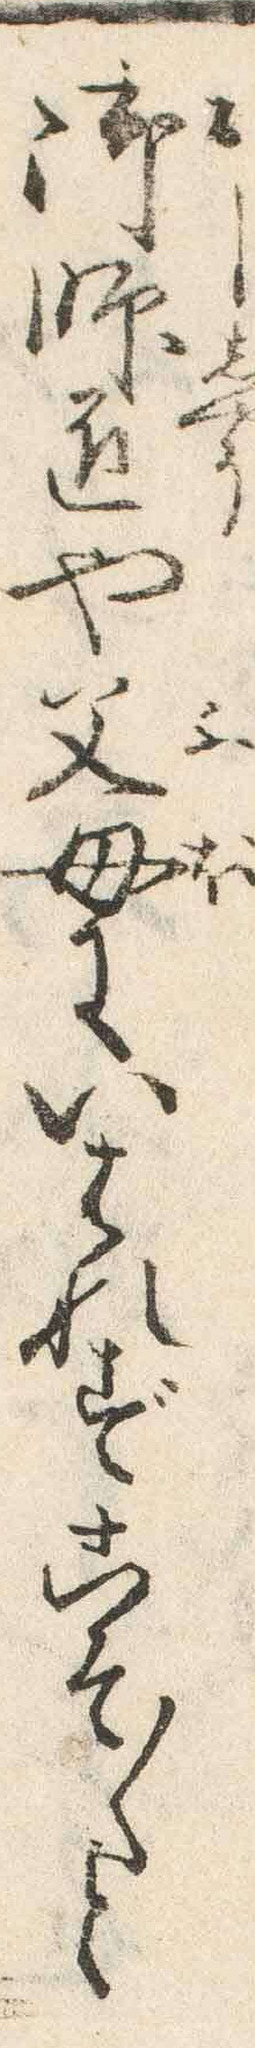御師匠や父母にいはれずこそ〳〵と
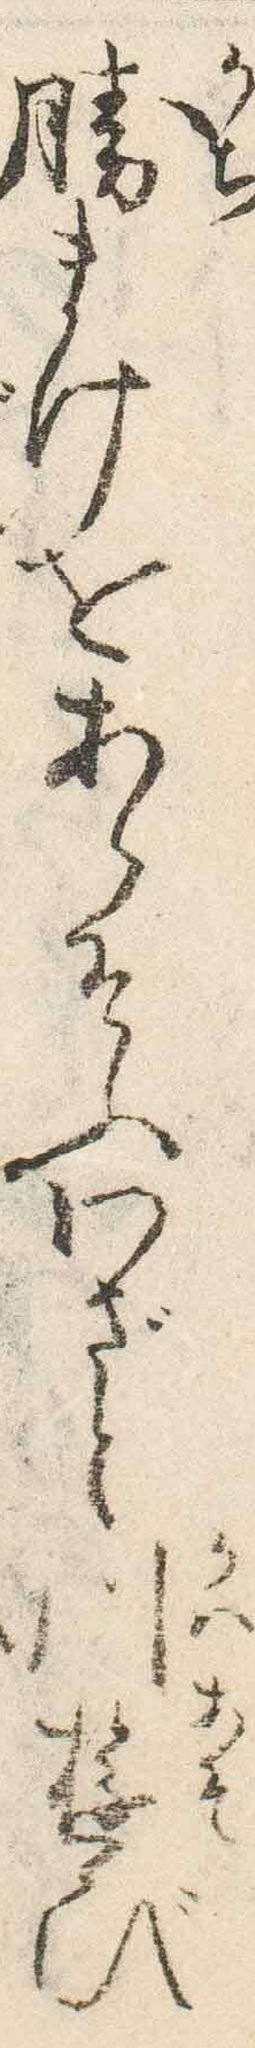勝まけをあらそふわざと川遊び
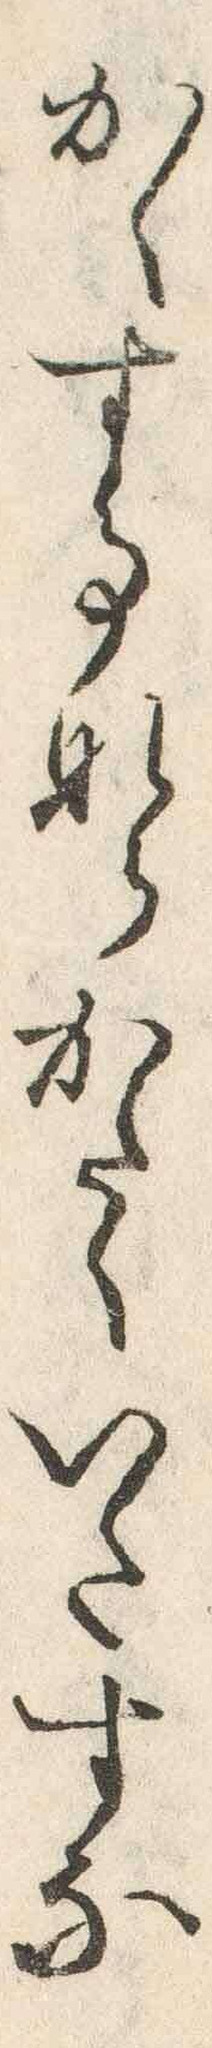かくす事ならかたくいたすな
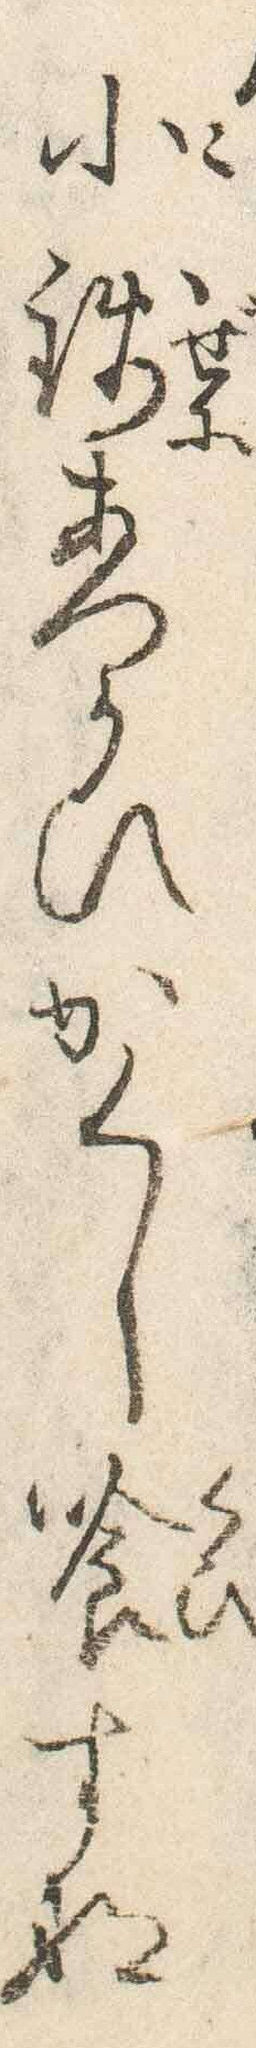小銭あつかひかくし喰すな
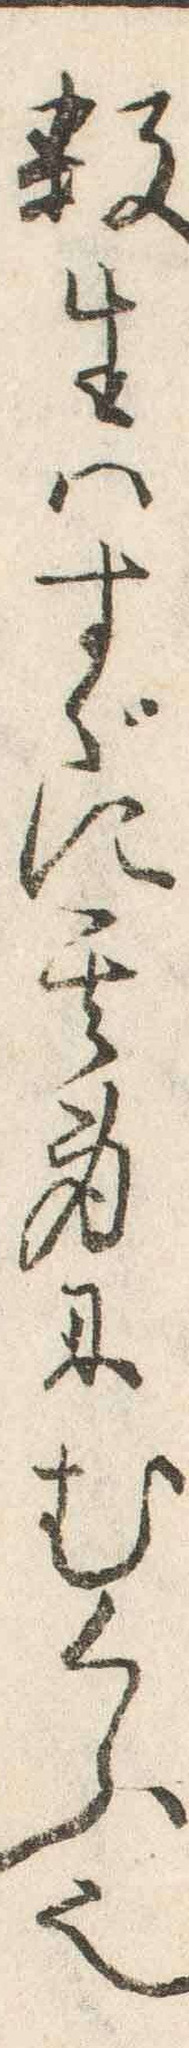殺生はすぐに其身にむくふ也
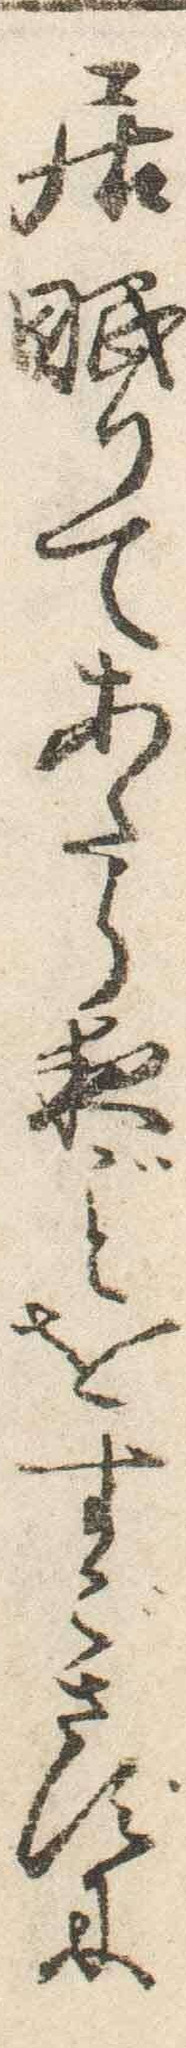居眠りてあたら夜ごとをすごさずに
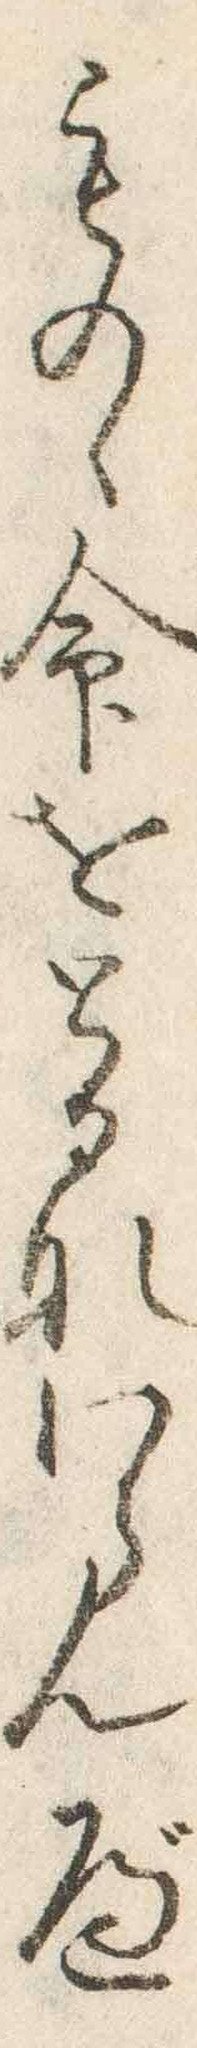ものゝ命をとるなわらんべ
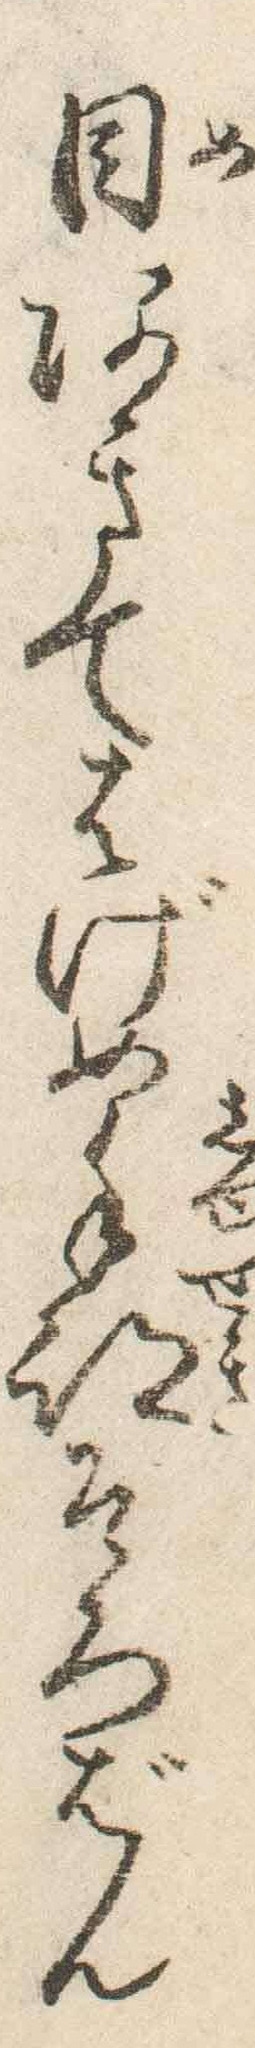目あきてはげめ手跡そろばん
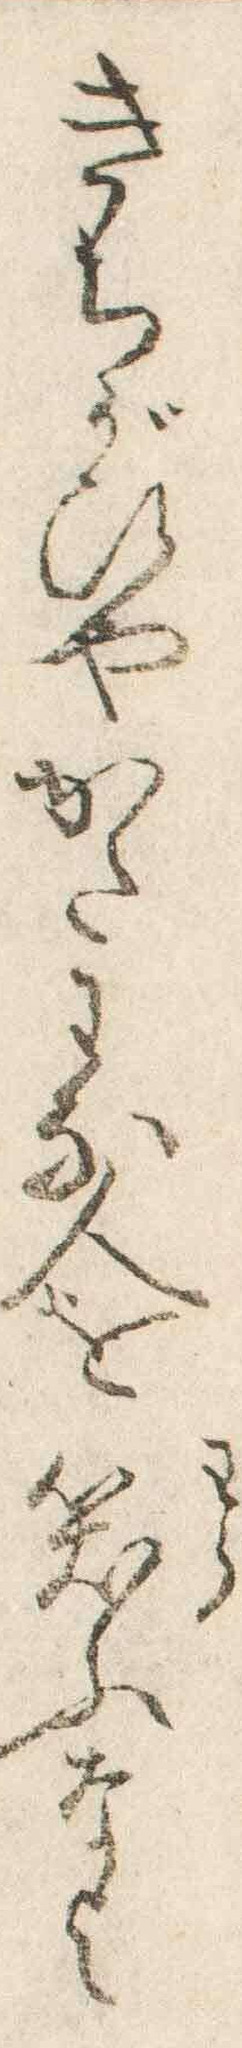きちがひやかたわな人を笑ふなよ
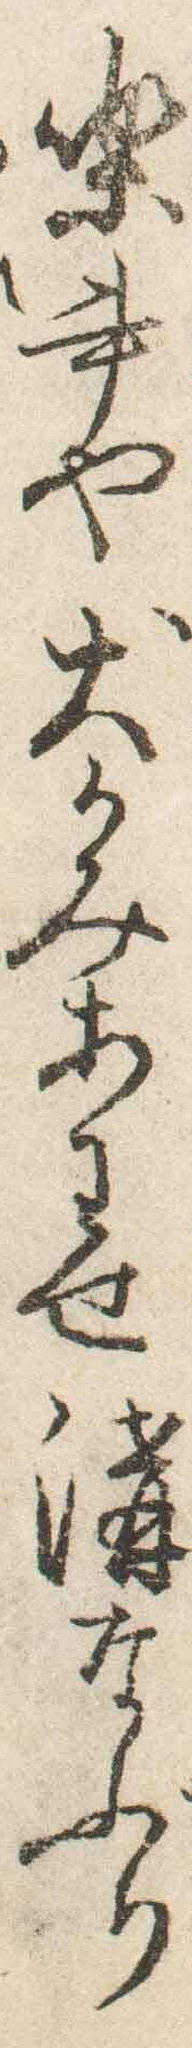楽書や犬かみあわせ溝なぶり
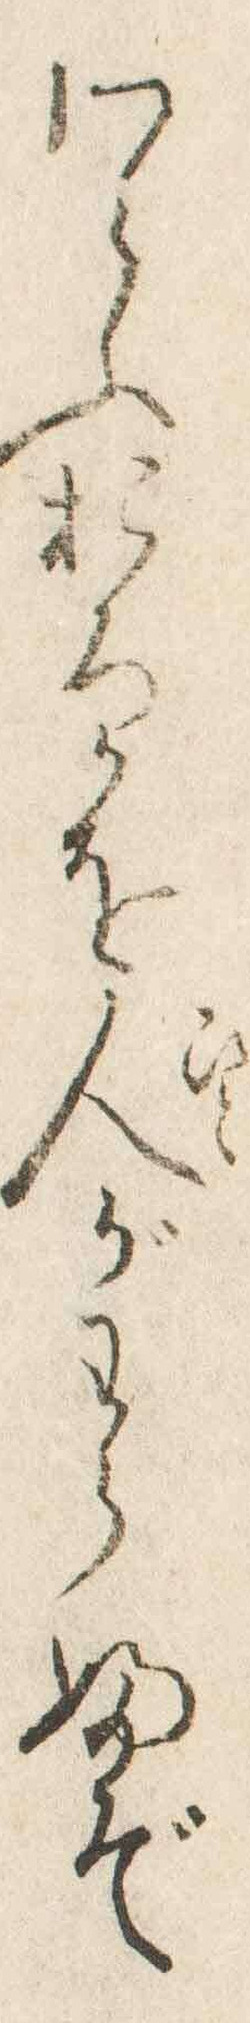わらふおろかを人がわらふぞ
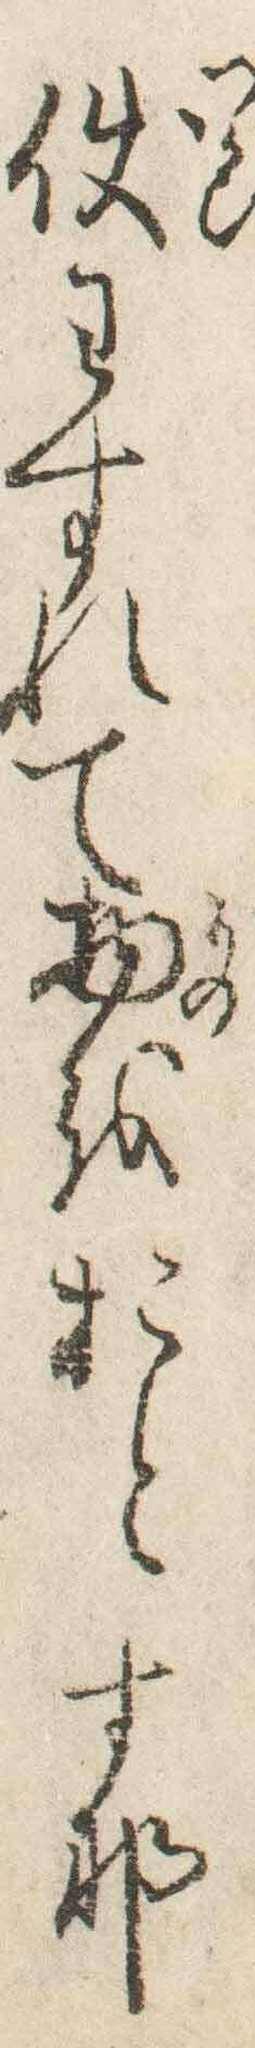使わすれて物をおとすな
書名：撫育草
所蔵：東京学芸大学附属図書館 国文学研究資料館
